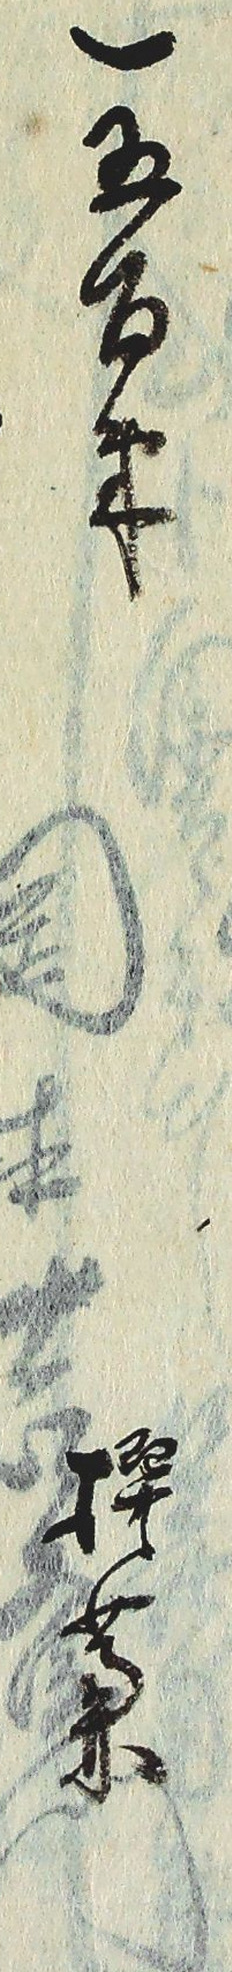一五百束撰藁
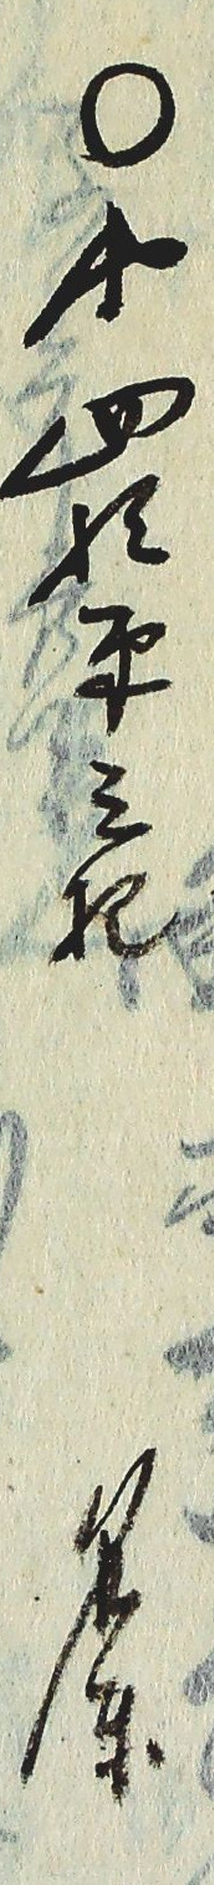内四拾束三把名東
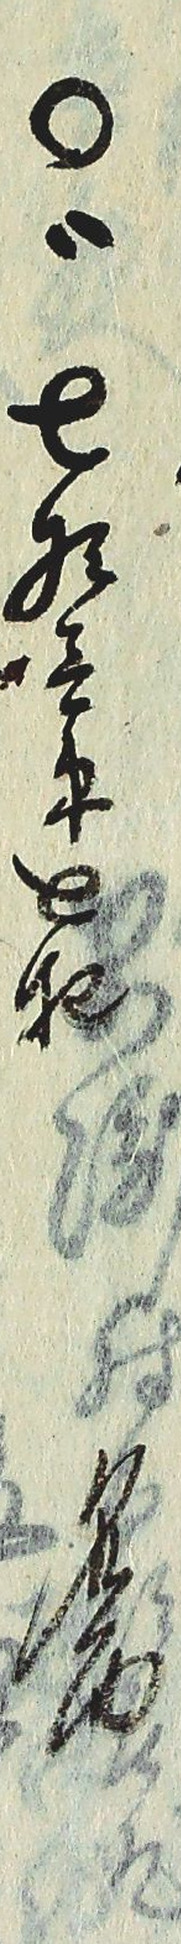同七拾壱束七把名西
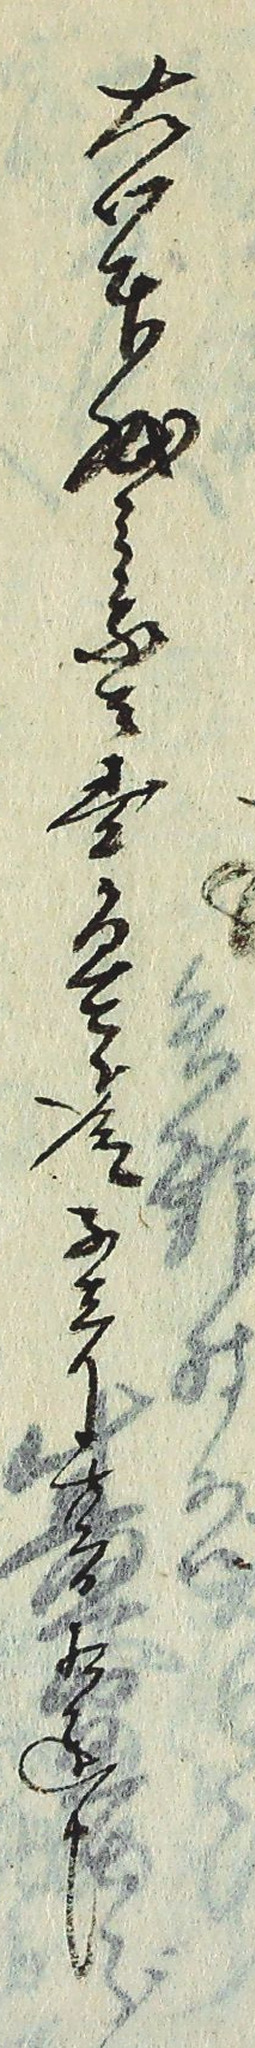右御本紙之義は盛宣七郎殿子十二月廿二日相達申候
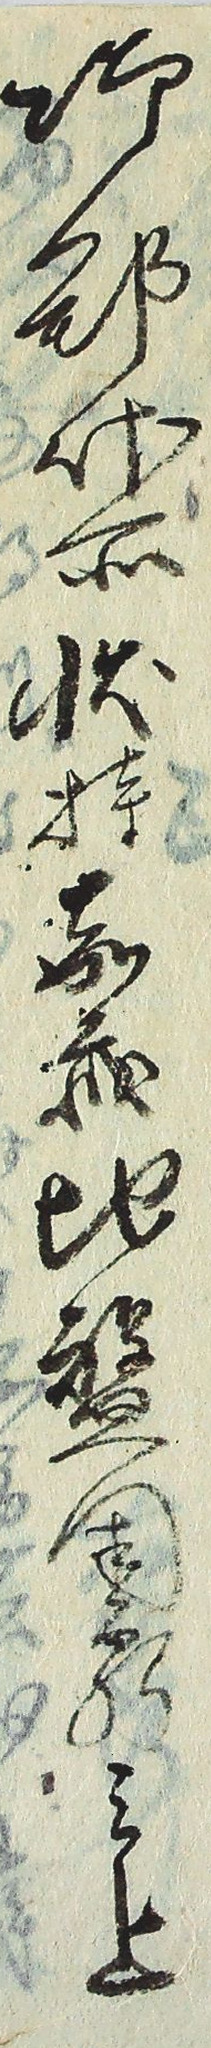御郡代所状持嘉蔵地盤困窮之上
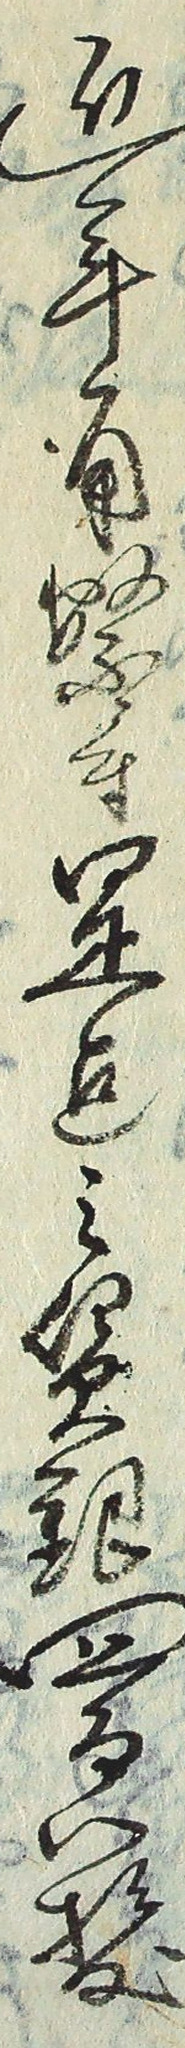近年御用繁に付是迄之賃銀四百八拾匁
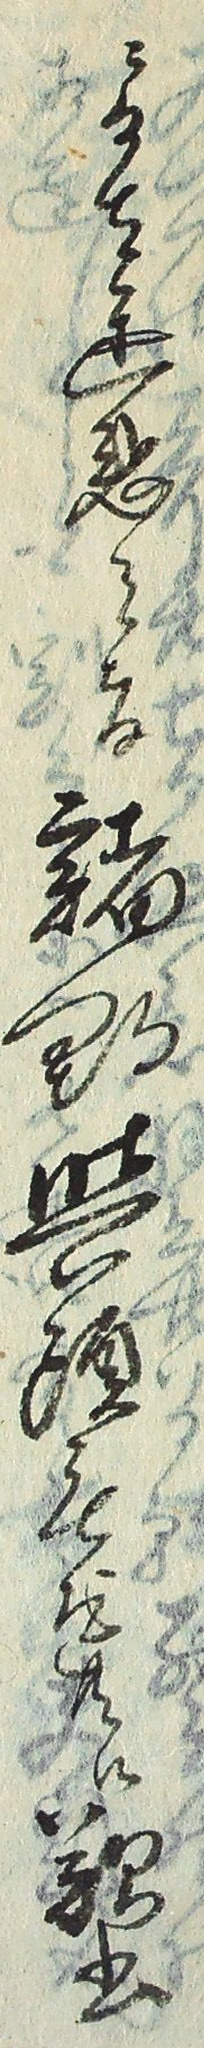にては迷惑之旨諸郡与頭庄屋共え歎出
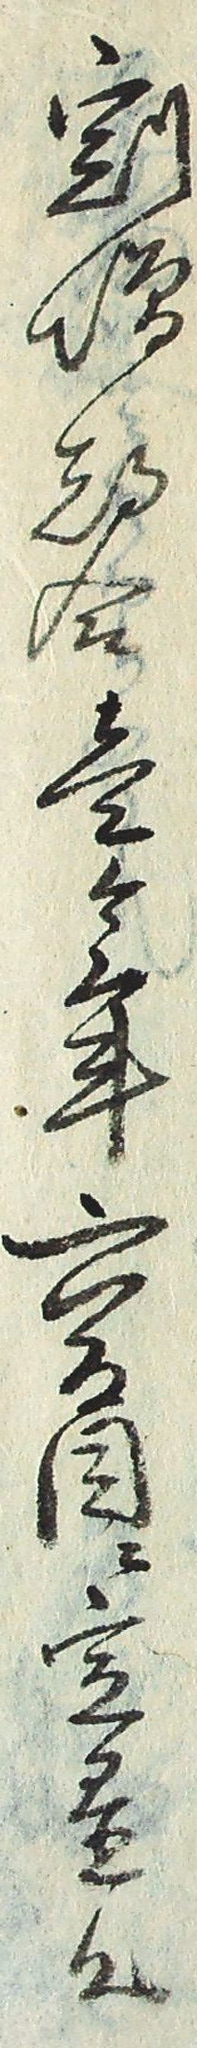割増都合壱ヶ年六百目に定置候

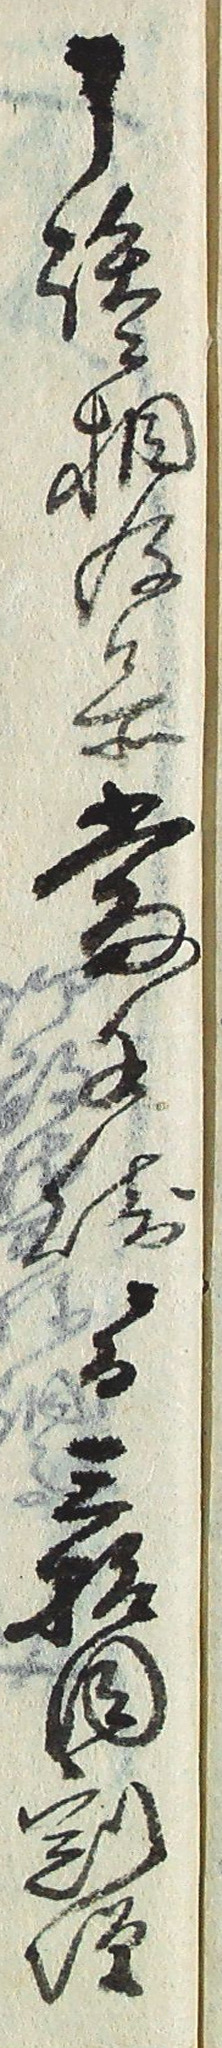申談に相及候所当手崎にて三拾目割増
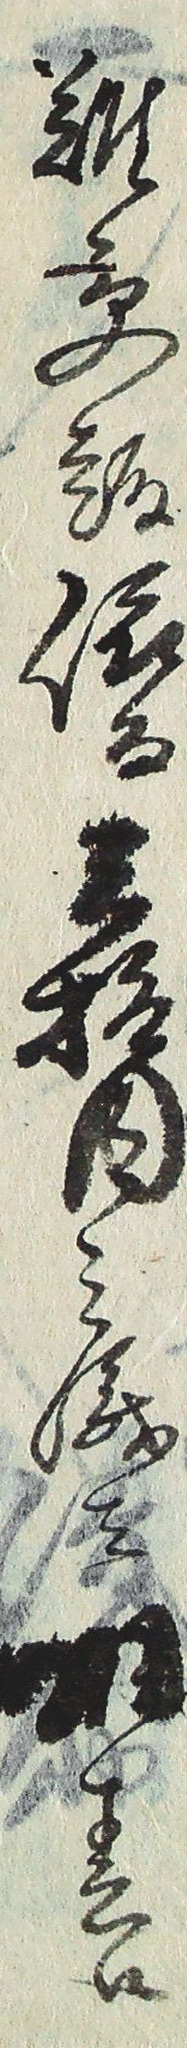難受趣依て三拾目之儀は明春え
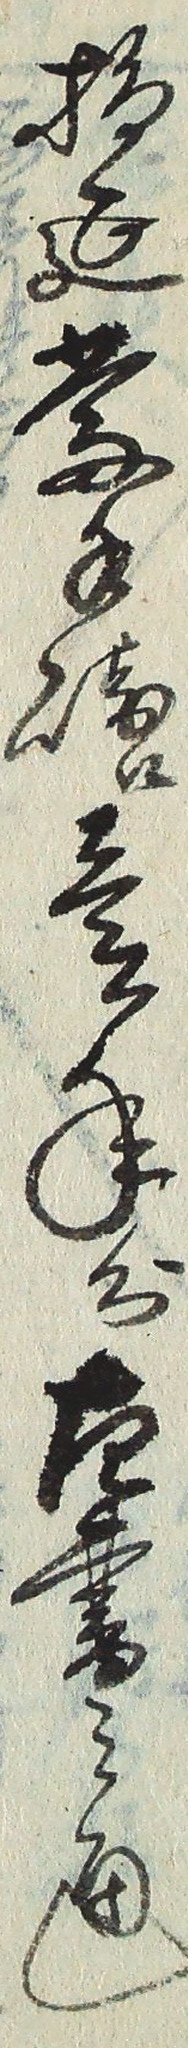指延当手崎え壱年分左書之通
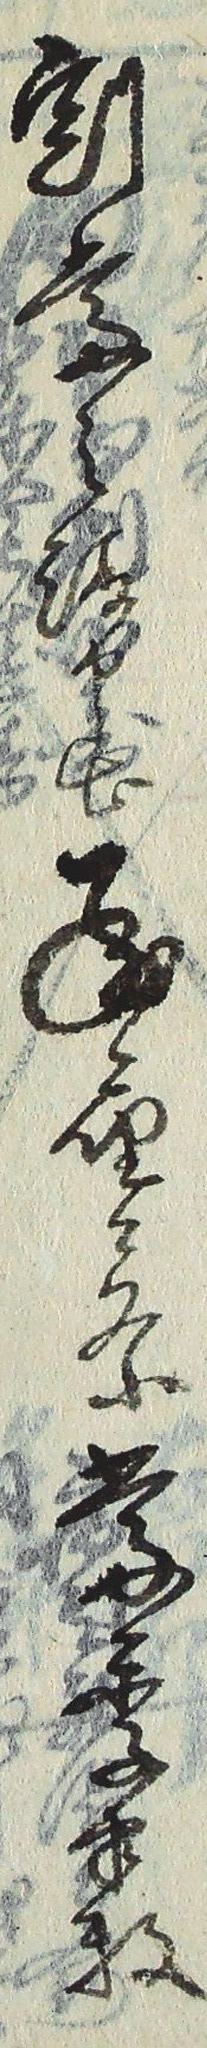割当之趣申出承届候条当季半数
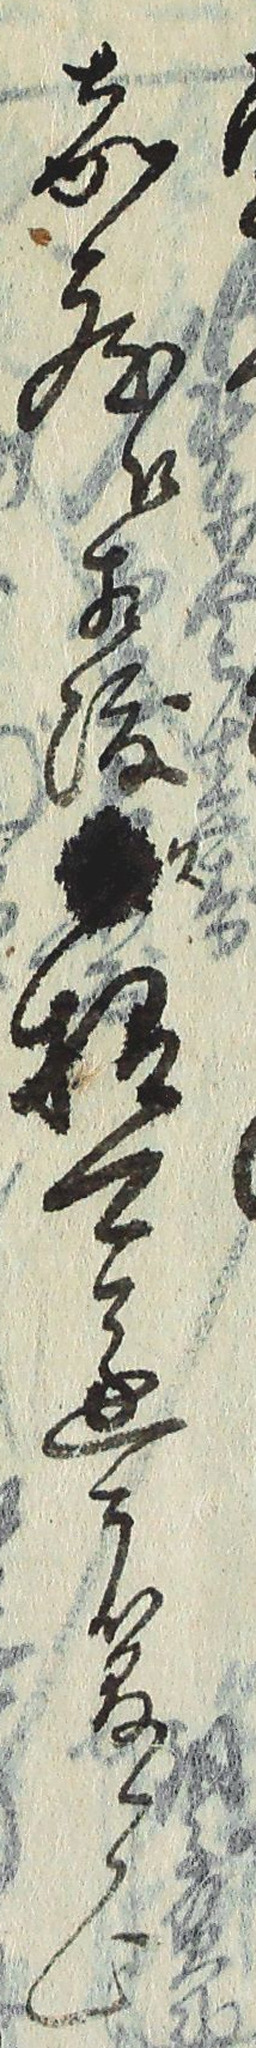嘉蔵え相渡候様可遂了簡候以上
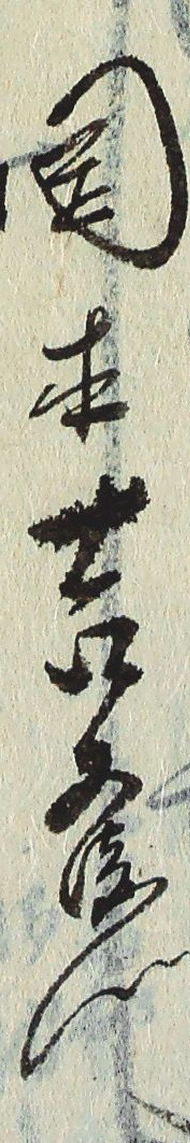岡本吉右衛門
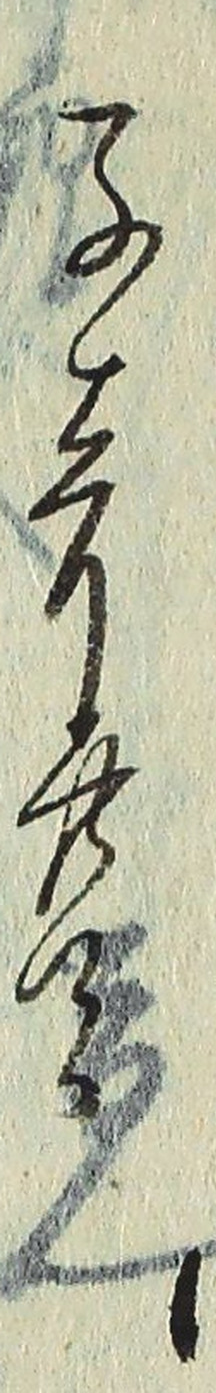子十二月廿四日
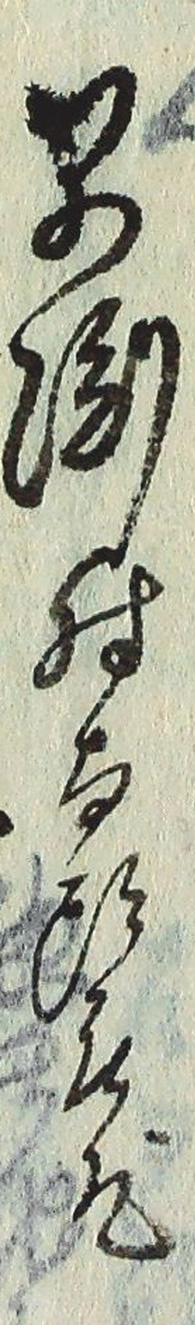早淵村与頭庄屋
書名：名東郡中諸割賦元帳
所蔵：鳴門教育大学 Naruto University of Education
